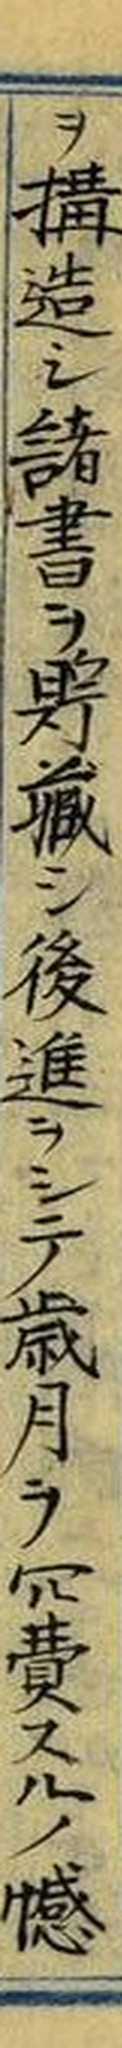ヲ搆造シ諸書ヲ貯藏シ後進ヲシテ歳月ヲ冗費スルノ憾
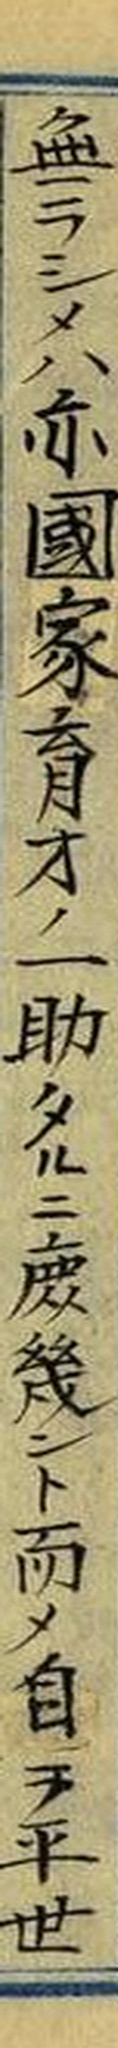無ラシメハ亦國家育才ノ一助タルニ庶幾ント而シテ自ヲ平世
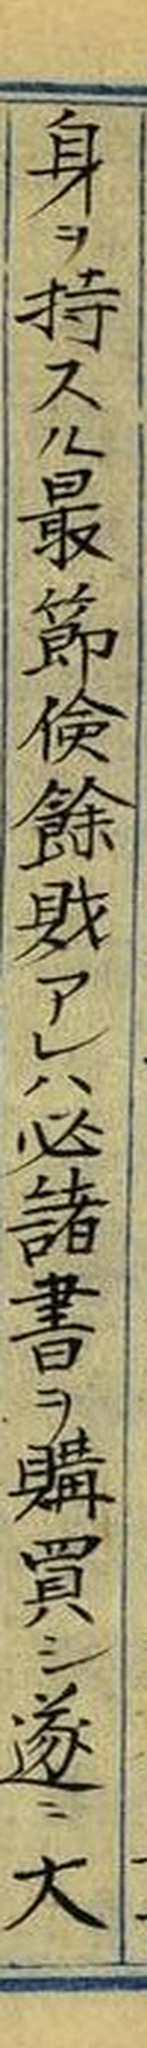身ヲ持スル最節倹餘財アレハ必諸書ヲ購買シ遂ニ大
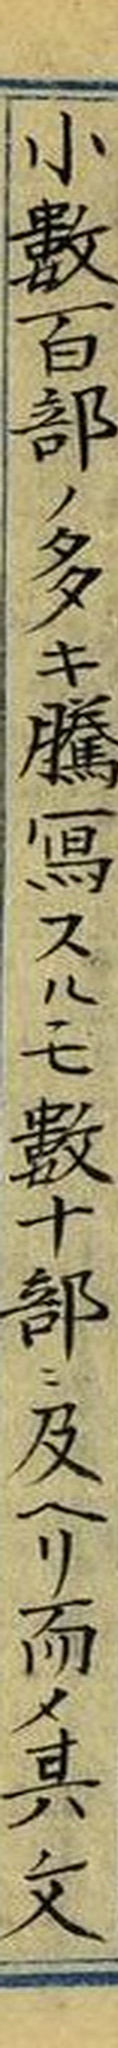小數百部ノ多キ謄冩スルモ數十部ニ及ヘリ而シテ其文
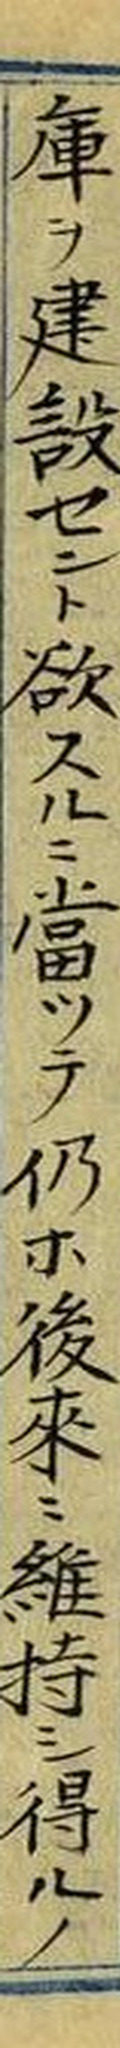庫ヲ建設セント欲スルニ當ツテ仍ホ後來ニ維持シ得ルノ
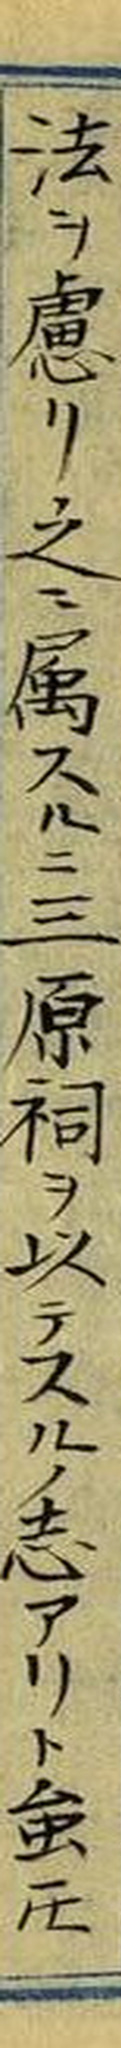法ヲ慮リ之ニ属スルニ三原祠ヲ以テスルノ志アリト雖トモ
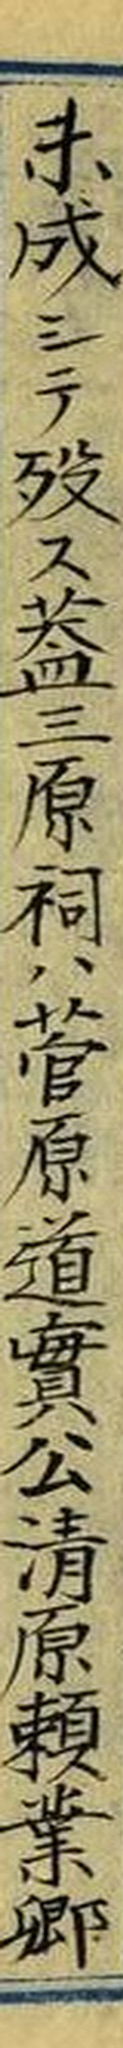未成シテ歿ス葢三原祠ハ菅原道實公清原頼業卿
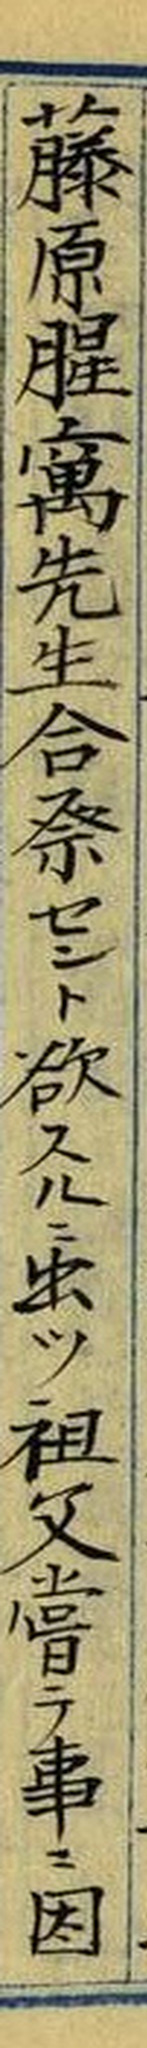藤原腥𥧆先生合祭セント欲スルニ出ツ祖父嘗テ事ニ困
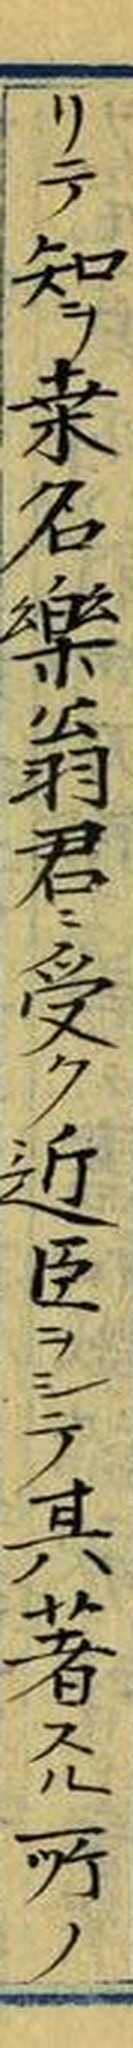リテ知ヲ桒名樂翁君ニ受ク近臣ヲシテ其著スル所ノ
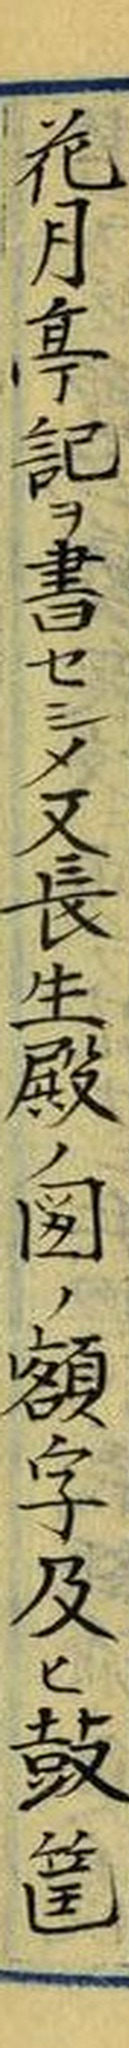花月亭記ヲ書セシメ又長生殿ノ図ノ額字及ヒ鼓筐
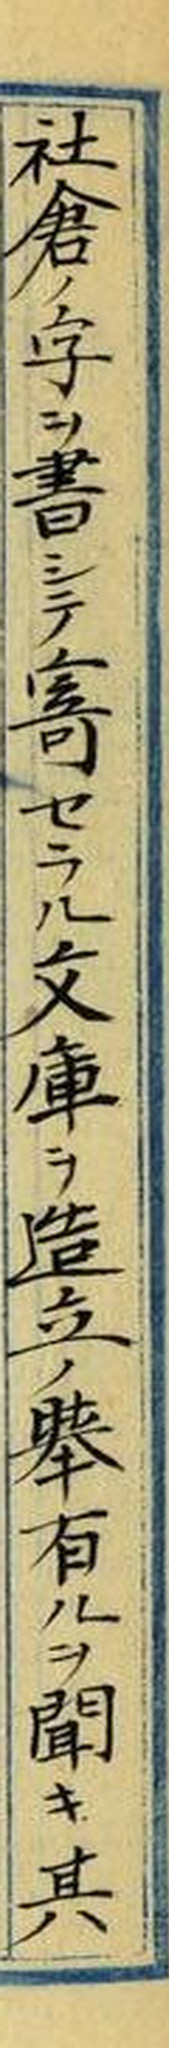社倉ノ字ヲ書シテ寄セラル文庫ヲ造立ノ舉有ルヲ聞キ其
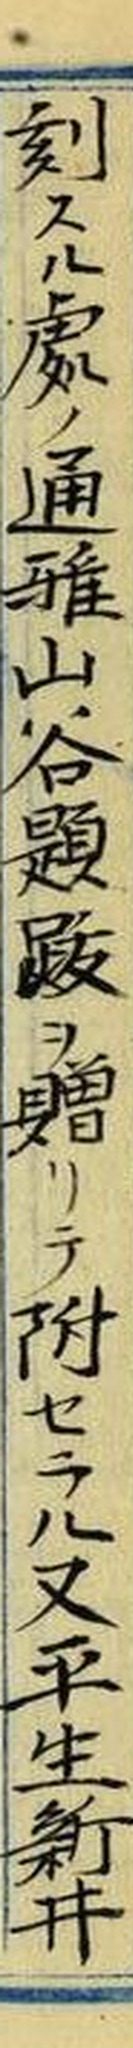刻スル處ノ通雅山谷題跋ヲ贈リテ附セラル又平生新井
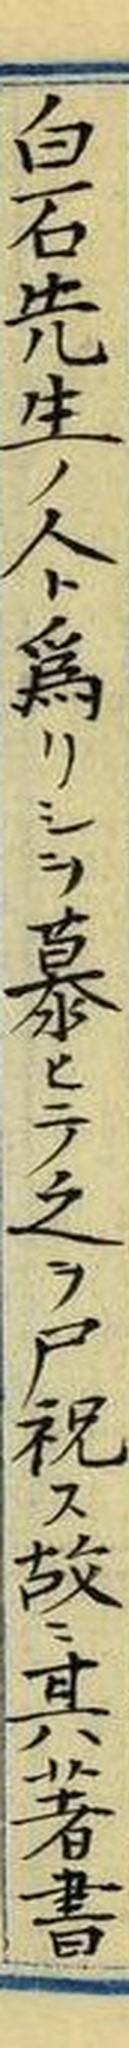白石先生ノ人ト爲リシヲ慕ヒテ之ヲ尸祝ス故ニ其著書
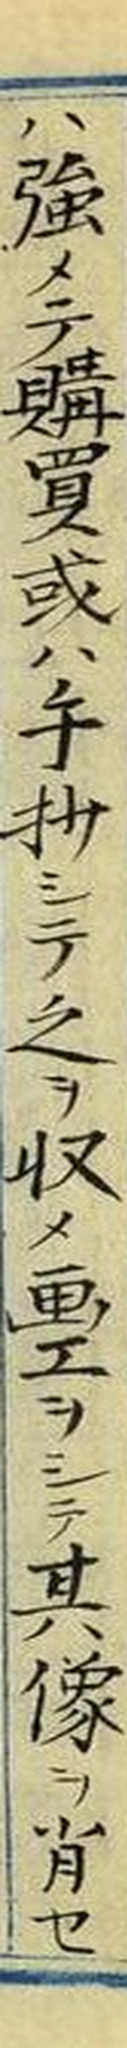ハ強メテ購買或ハ手抄シテ之ヲ収メ画工ヲシテ其像ヲ肖セ
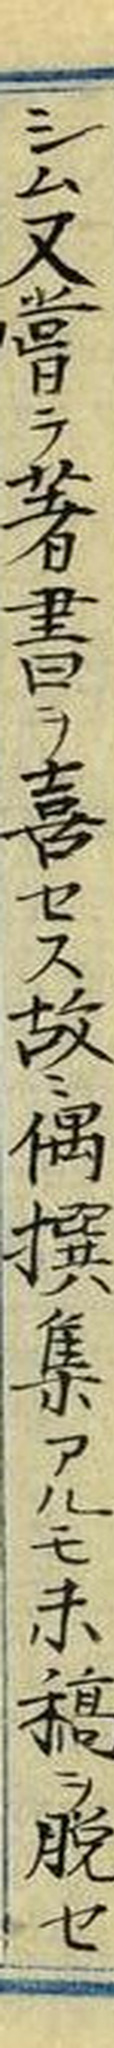シム又嘗テ著書ヲ喜セス故ニ偶撰集アルモ未稿ヲ脱セ
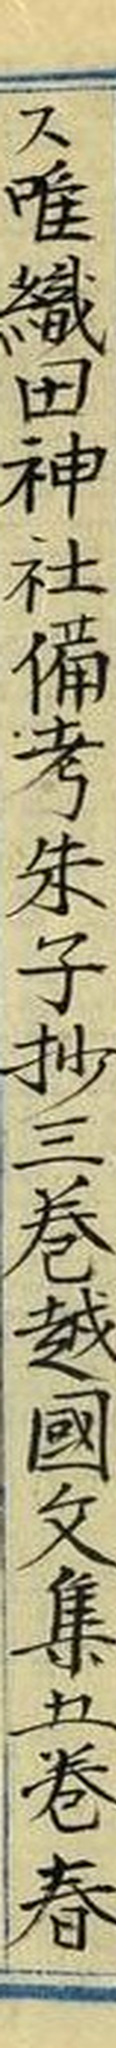ス唯織田神社備考朱子抄三巻越國文集五巻春
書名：温古集 四巻
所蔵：福井県文書館 Fukui Prefectural Archives
